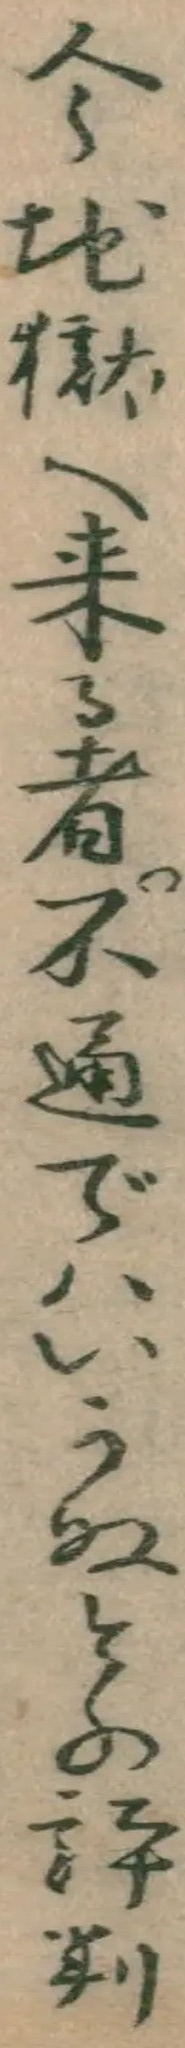人々地獄へ来る者。不通ではいかぬとの評判
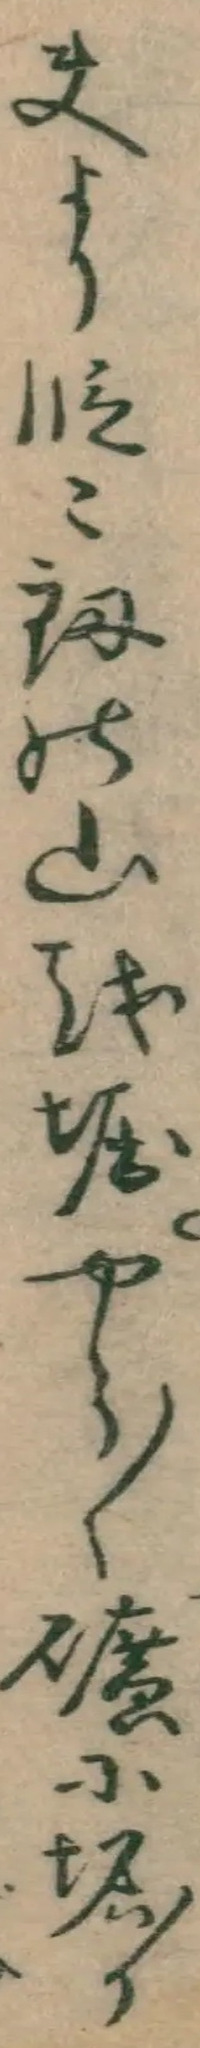夫より段々釼の山を堀。やう〳〵礦に堀り
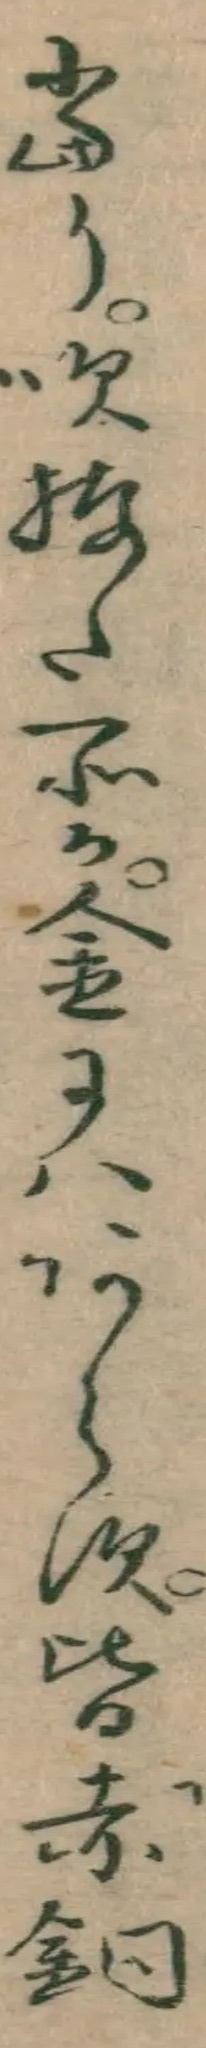当り。吹拵た所か。金にはあらす。皆赤銅
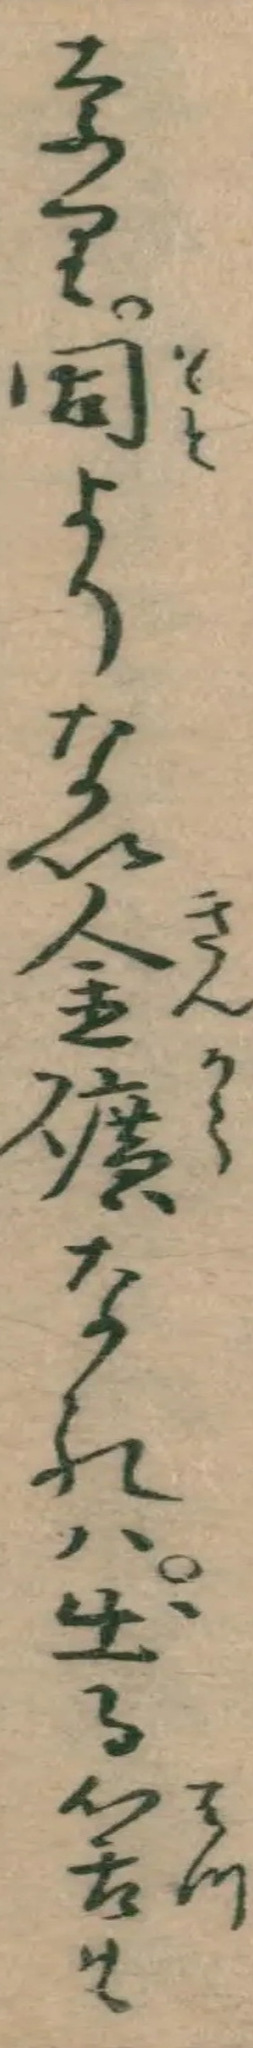なり。固よりない金礦なれは。出る筈も
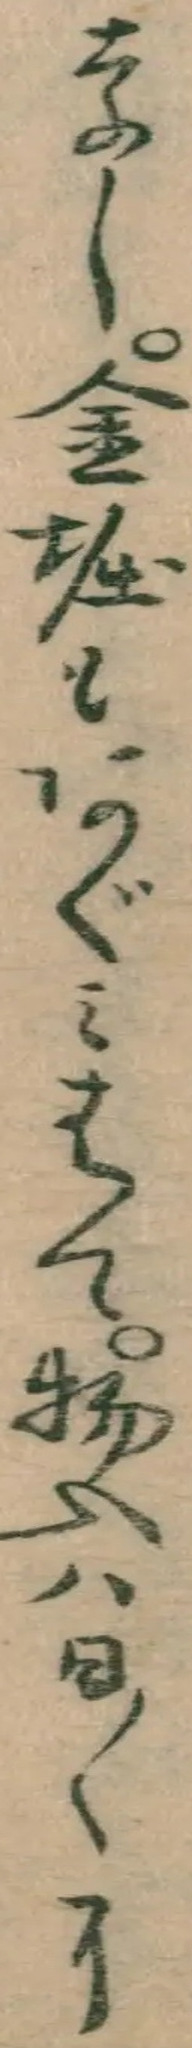なし。金堀もあぐみはて。物入は日〳〵に
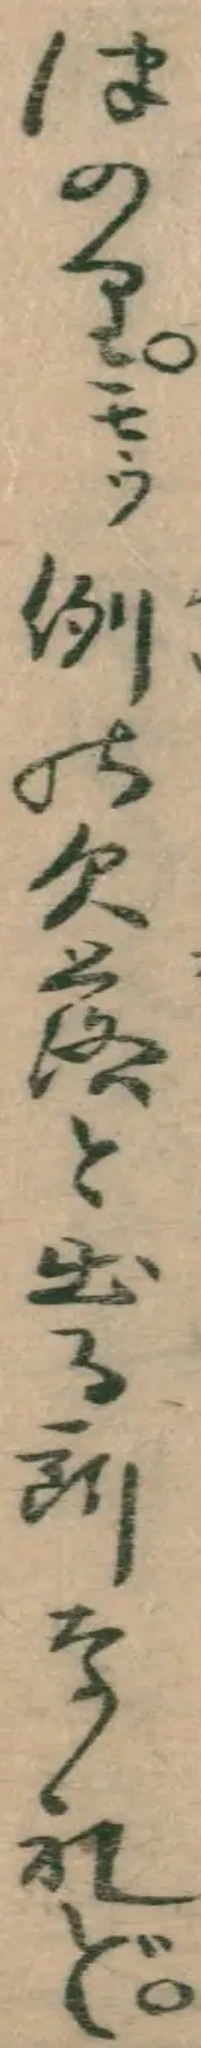つのり。モウ例の欠落と出る所なれど。
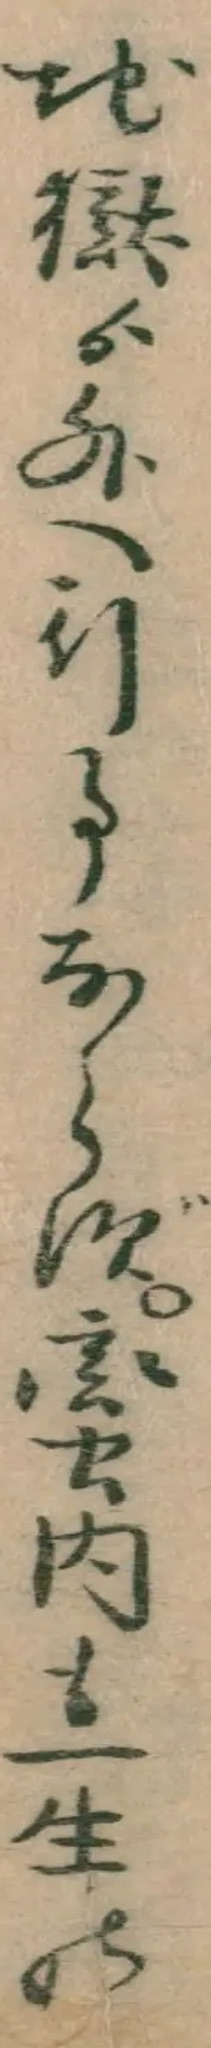地獄より外へ行事ならず。蛮内も一生の
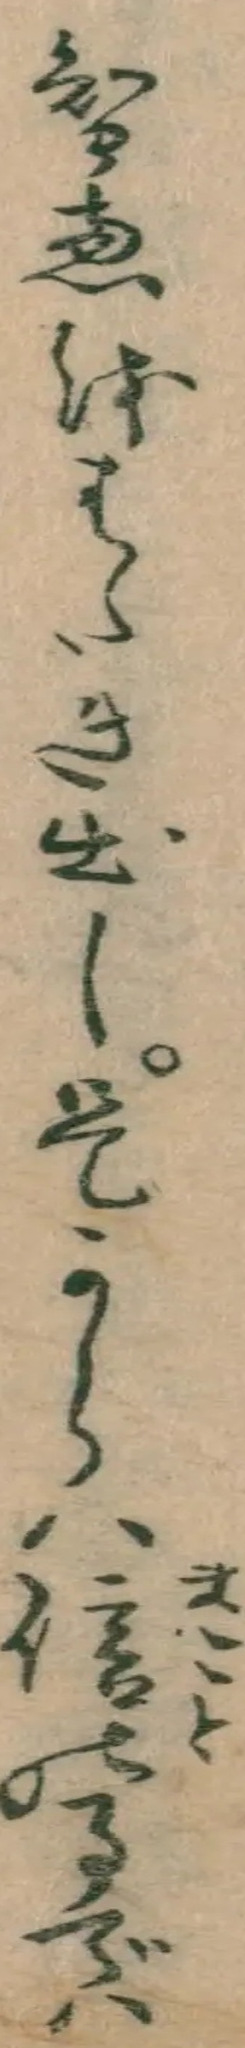智恵をはたき出し。是からは信の事では
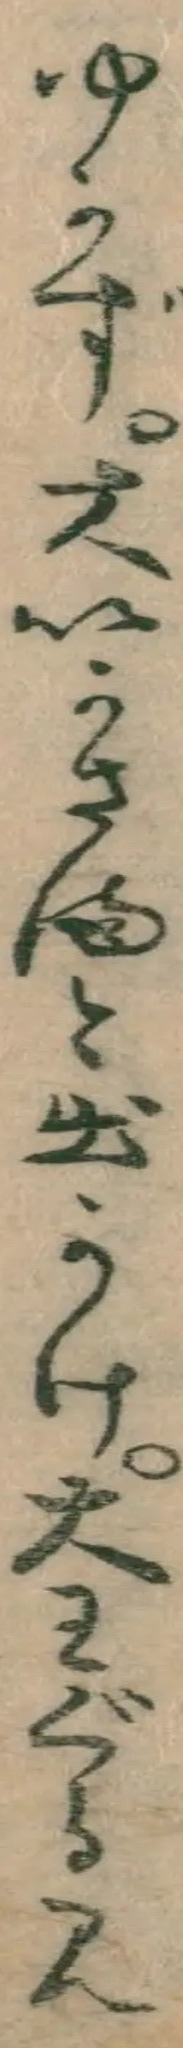ゆかず。大いかさまと出かけ。大王ぐるみ
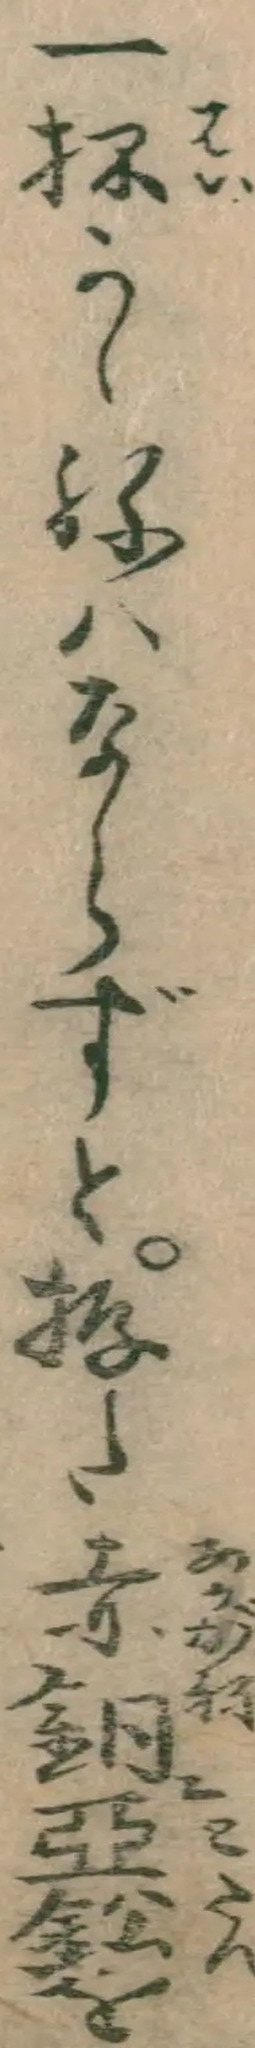一杯かゝねはならずと。拵た赤銅亜鉛を
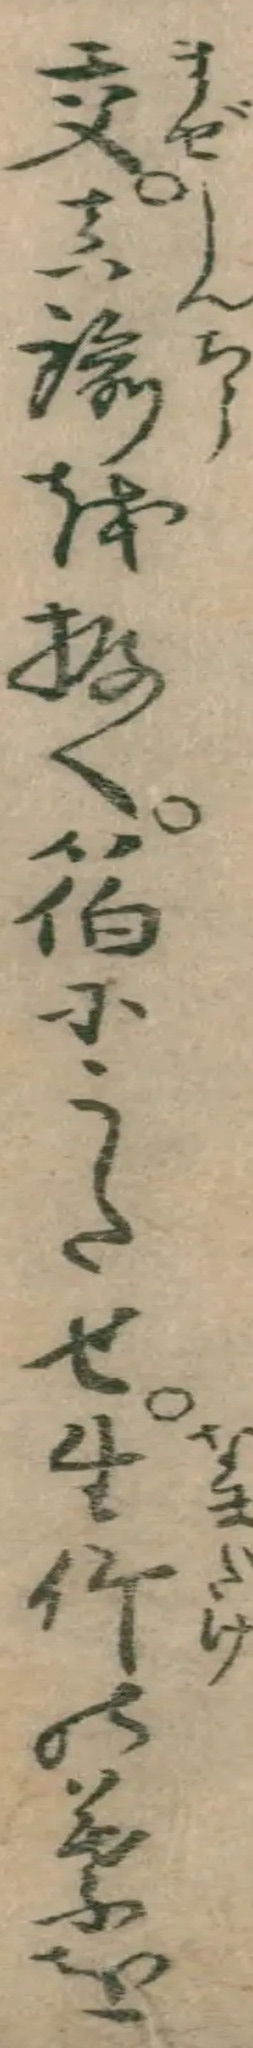交。真鍮を拵へ。箔にうたせ。生竹の葉を
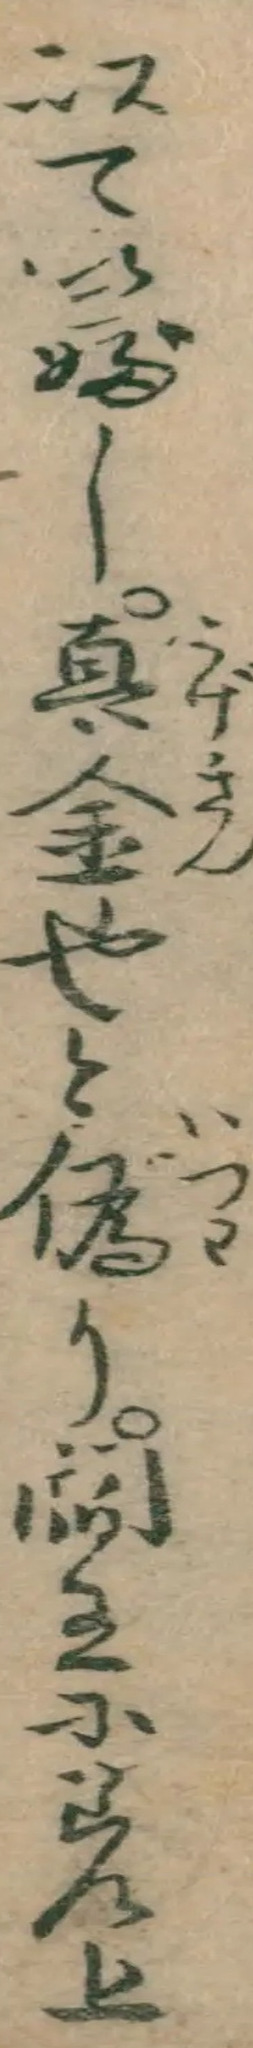以ていぶし。焦金也と偽り。閻王に差上

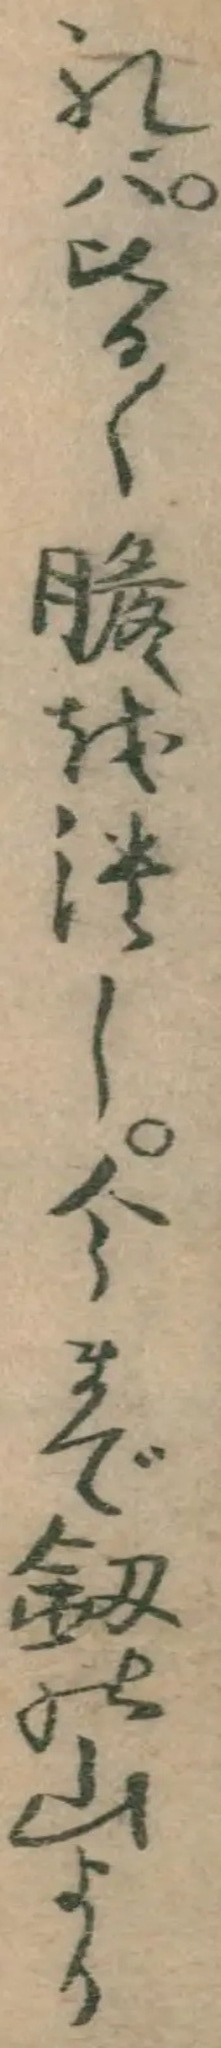れは。皆〳〵胆を潰し。今まで釼の山より
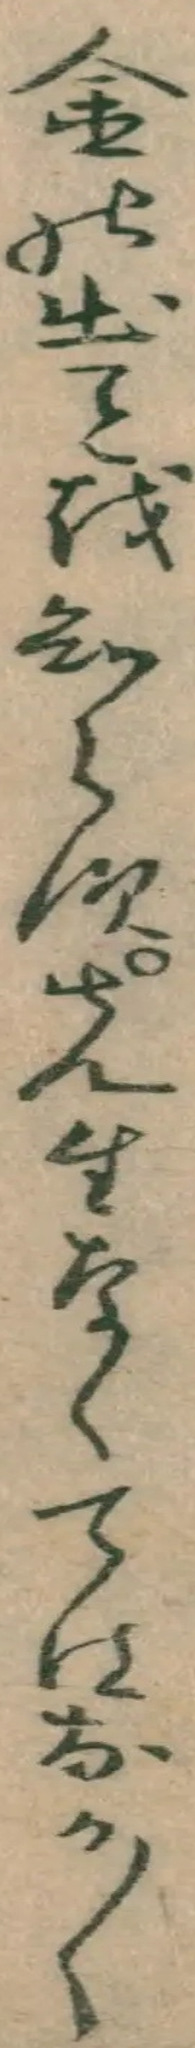金の出ことを知らす。先生なくてはなか〳〵
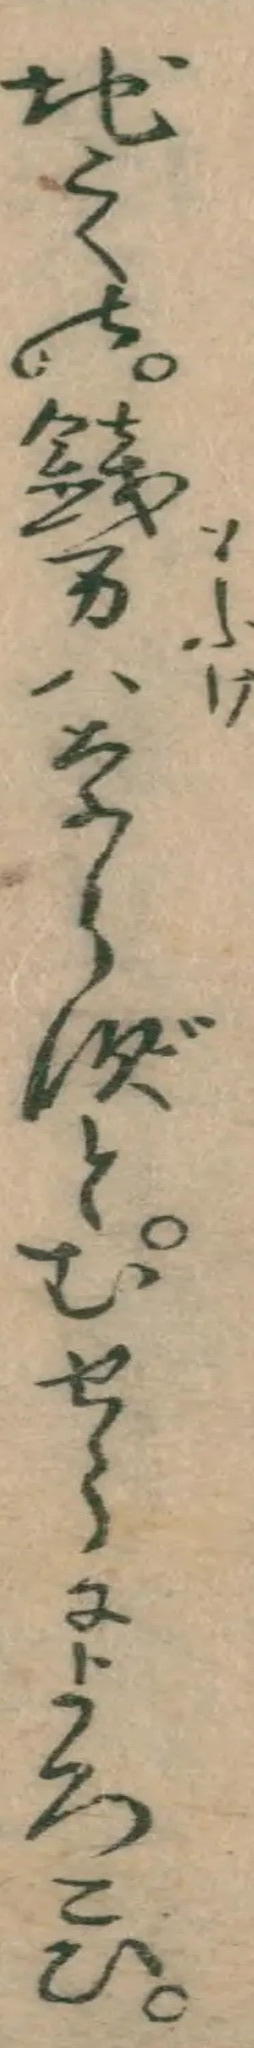地こくの。銭万はならずと。むせうによろこひ。
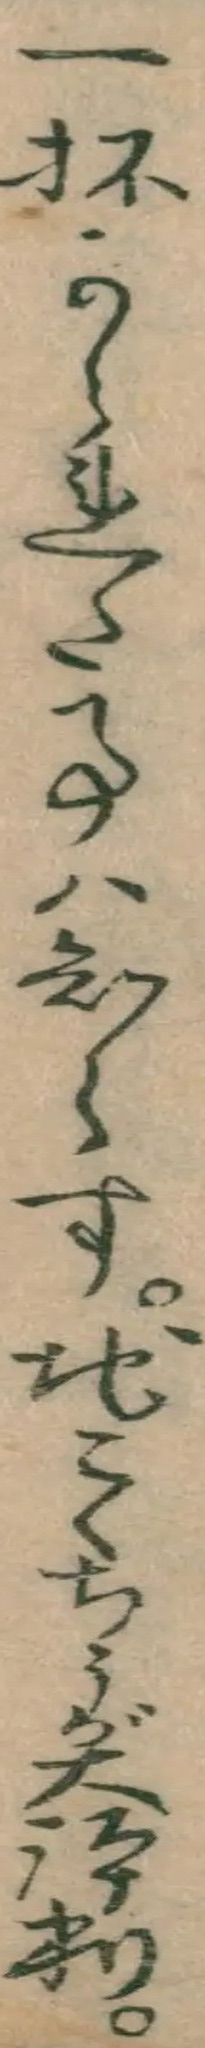一杯かゝれた事は知らす。地こくちうが大評判。
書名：翻草盲目
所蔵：国立国会図書館 National Diet Library, JAPAN
